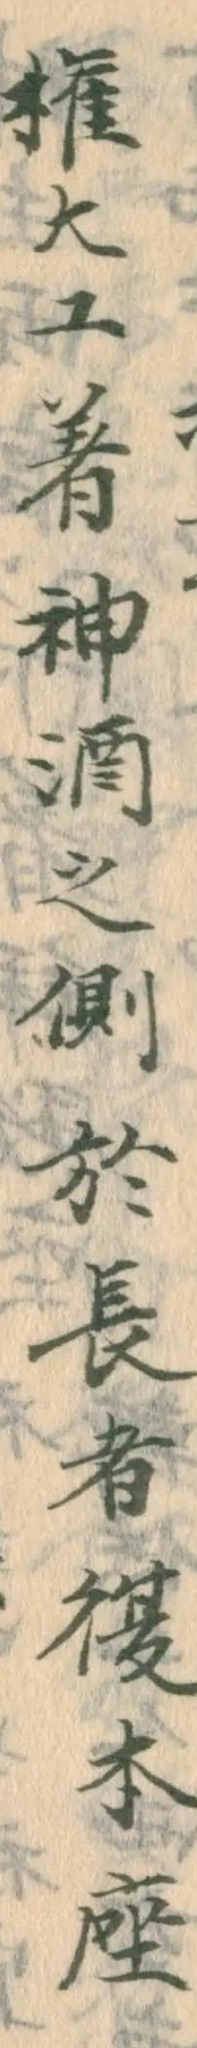権大工着神酒之側於長者復本座
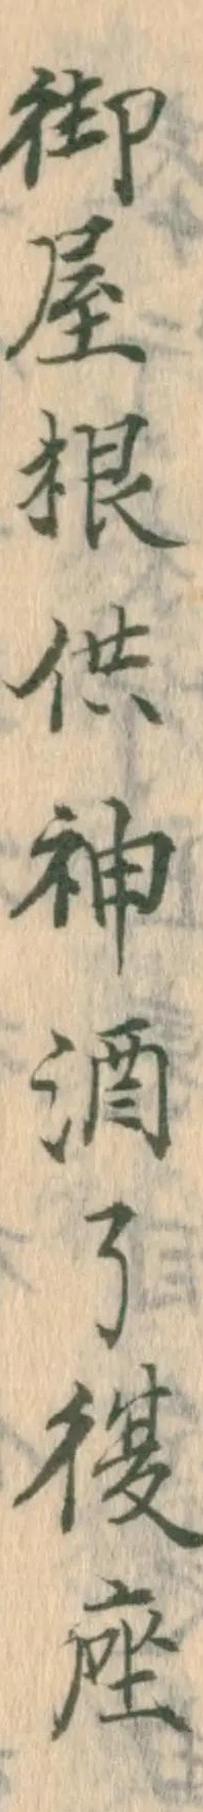御屋根供神酒了復座
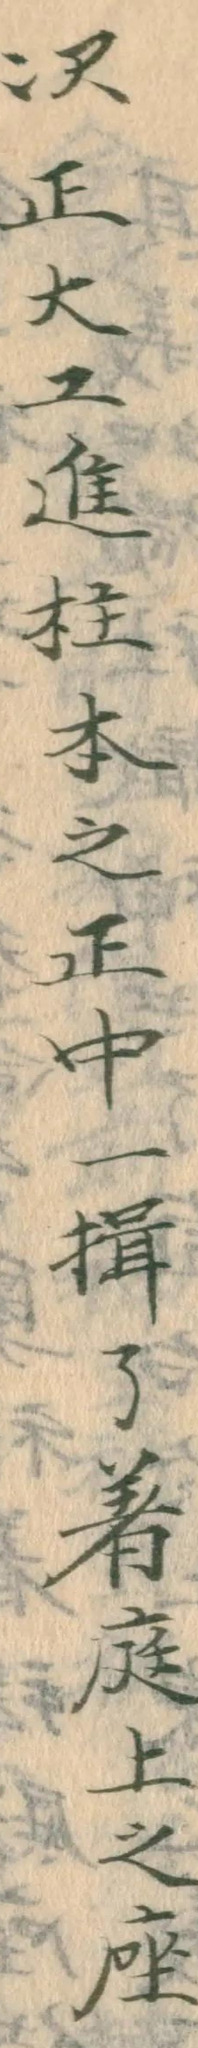次正大工進柱本之正中一揖了着庭上之座
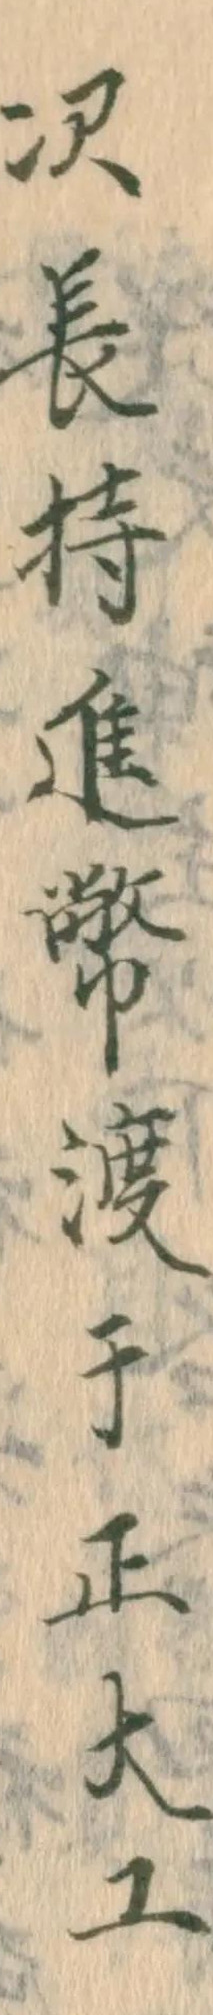次長持進幣渡于正大工
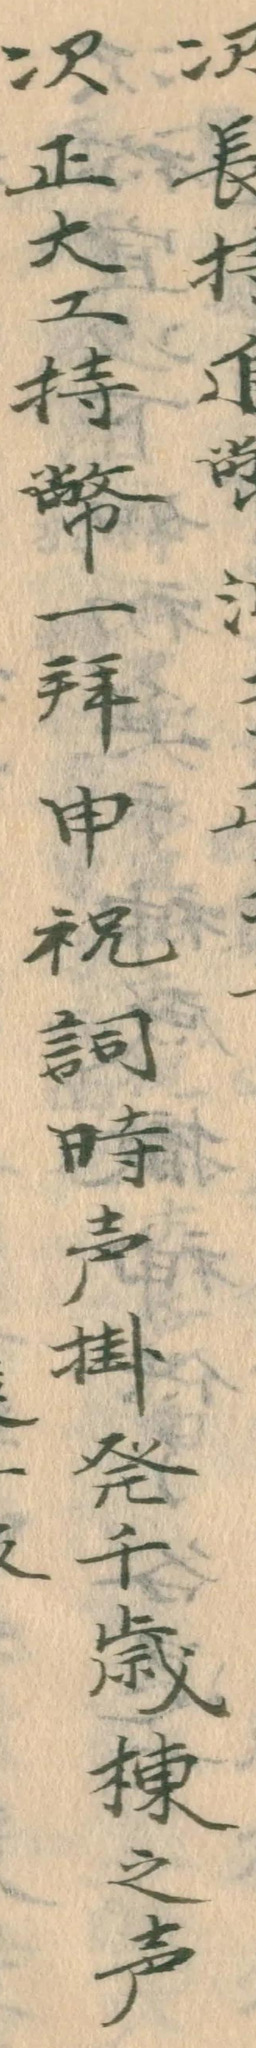次正大工幣一拝申祝詞時声掛発千歳棟之声
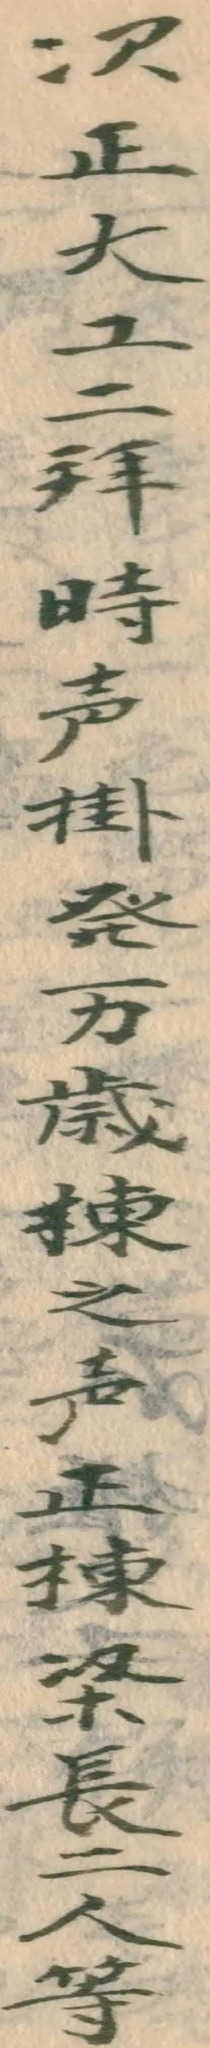次正大工二拝時声掛発万歳棟之声正棟梁長二人等
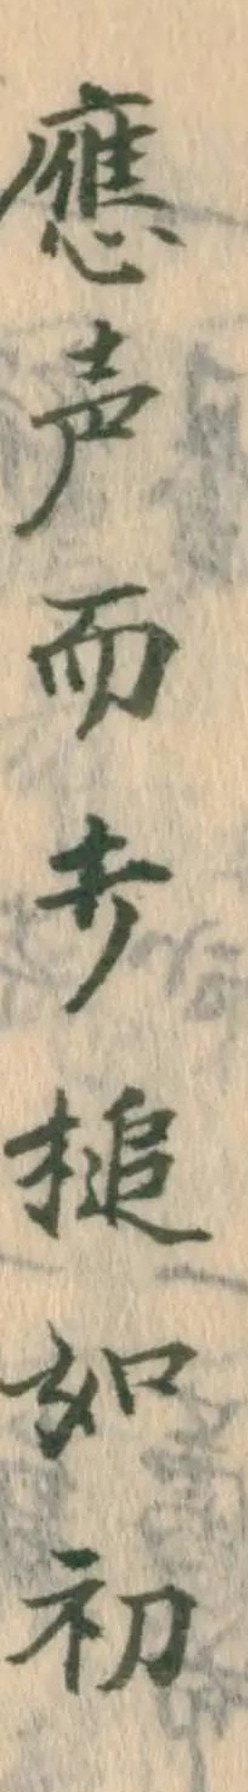応声而打槌如初
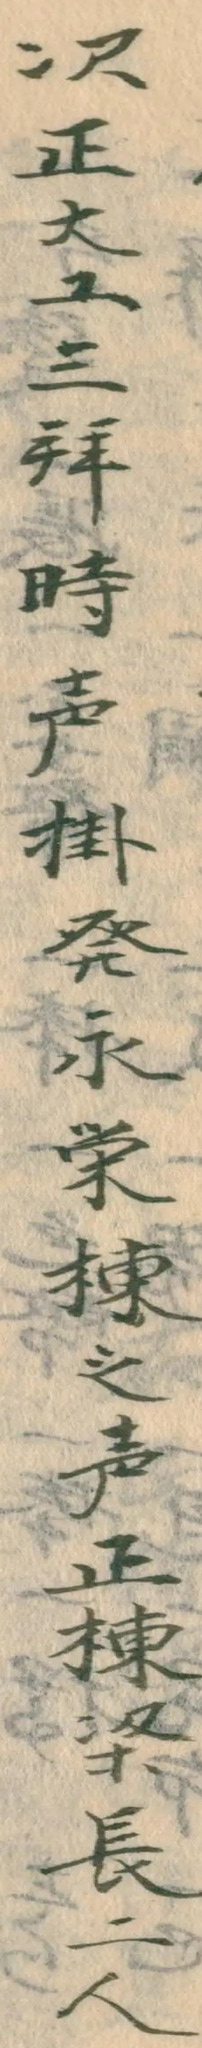次正大工三拝時戸掛発永栄棟之声正棟梁長二人
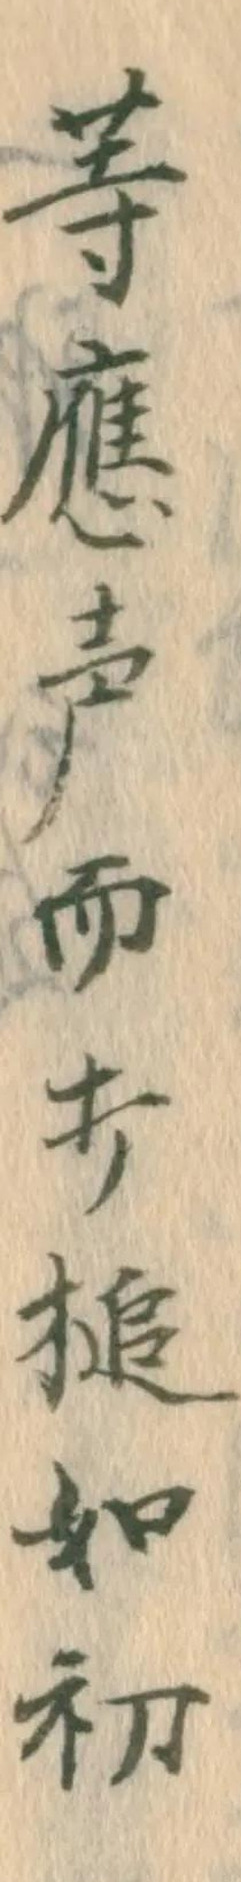等応声而打槌如初
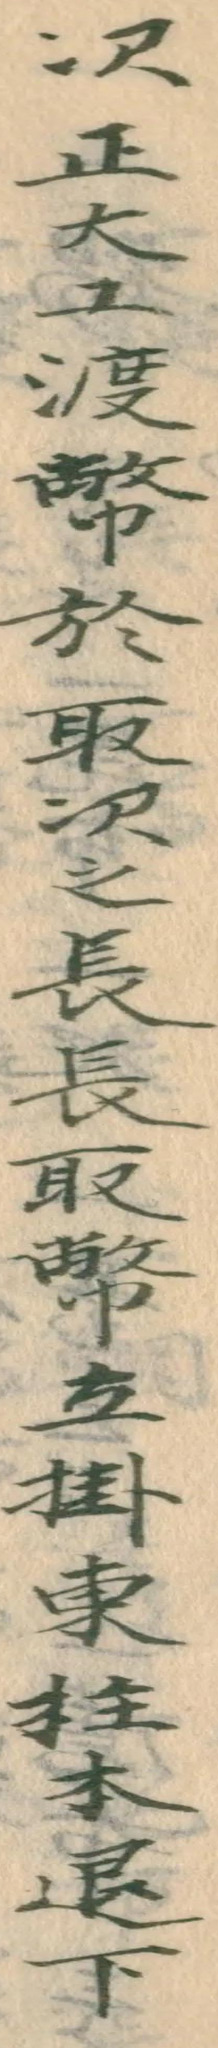次正大工渡幣於取次之長長取幣立掛東柱本退下
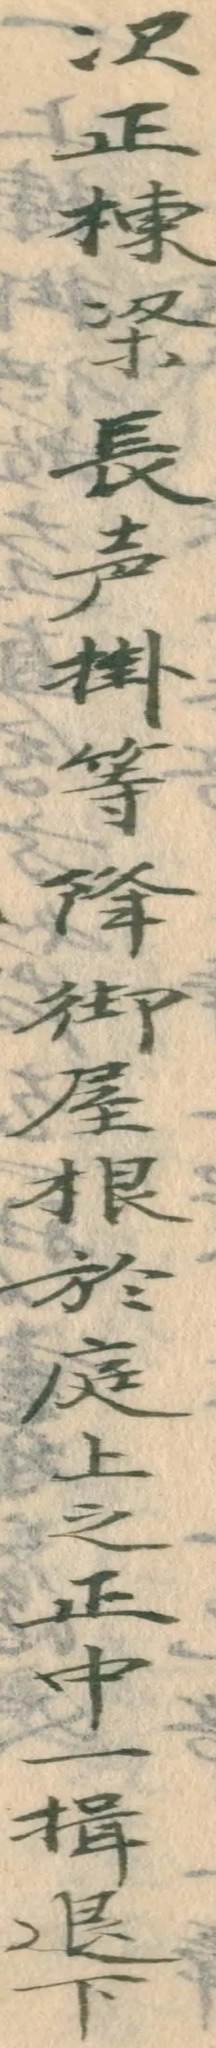次正棟梁長声掛等降御屋根於庭上之正中一揖退下
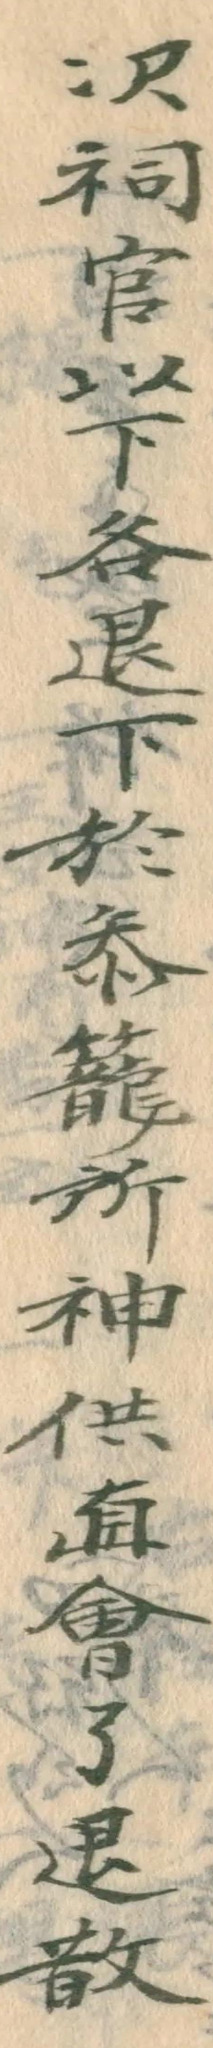次祠官以下各退下於参籠所神供直会了退散
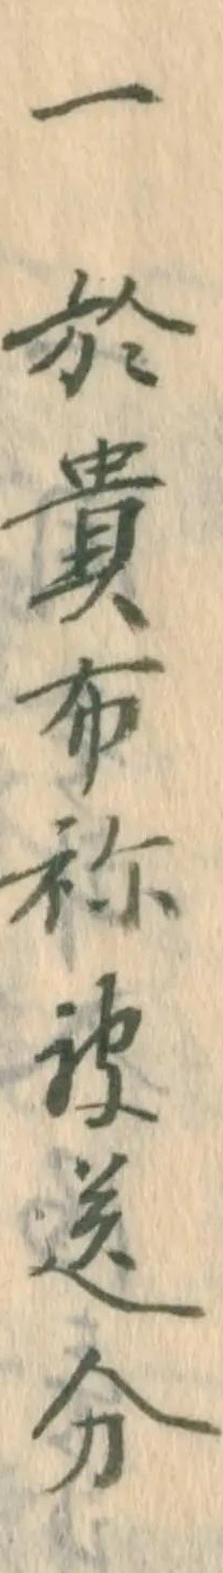一於貴布祢被送分

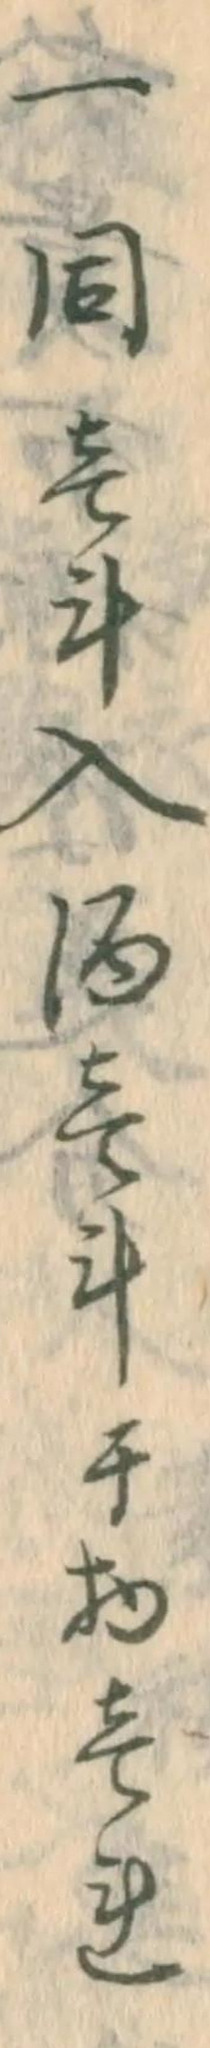一同壱斗入酒壱斗干物壱連谷中
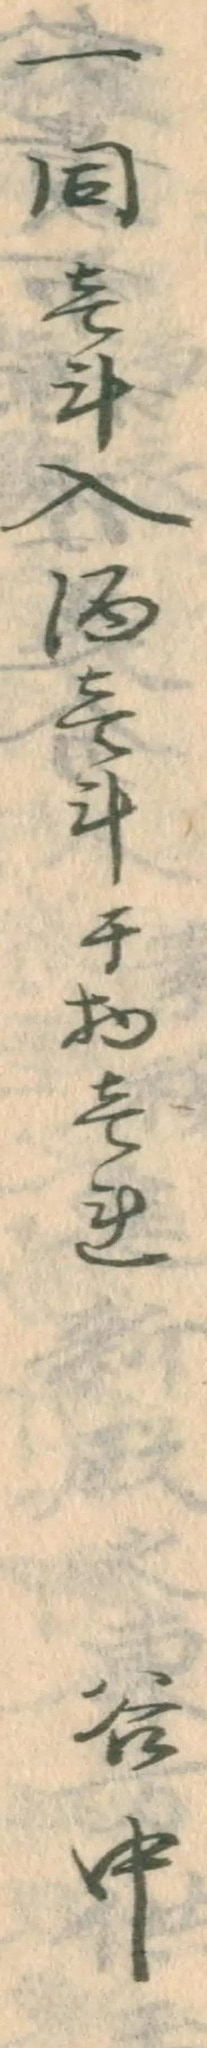一同壱斗入酒壱斗干物壱連谷中
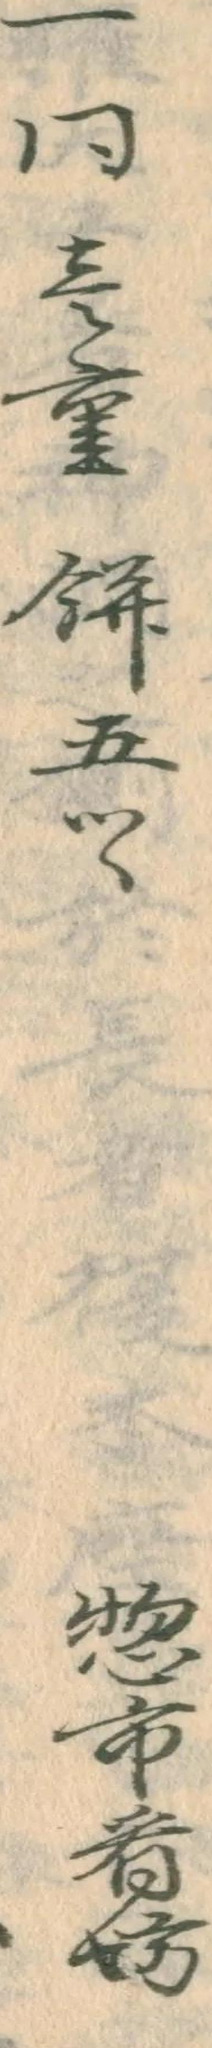一同壱重餅五ツヽ惣市看坊
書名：賀茂社記録. 第17冊
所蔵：国立国会図書館 National Diet Library, JAPAN
